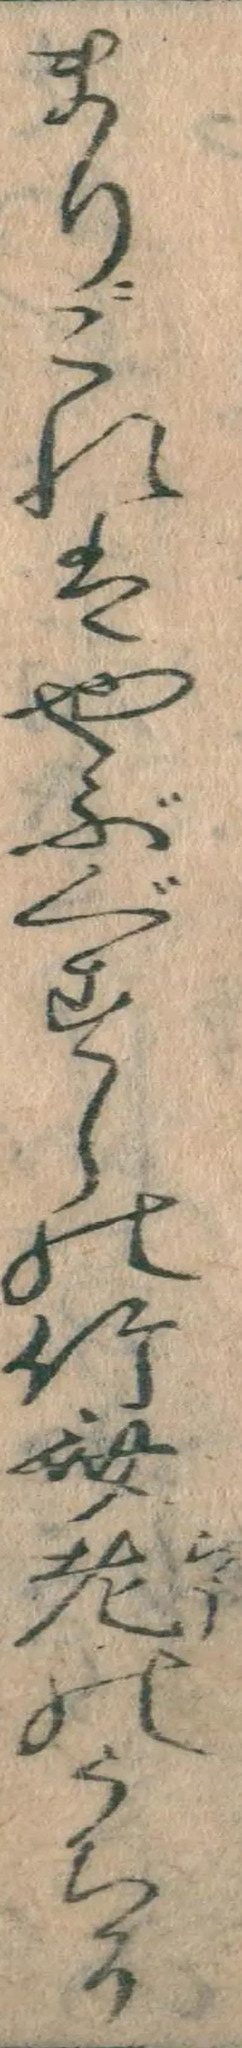まり。これはやぶぐすしの竹斎老のうちに
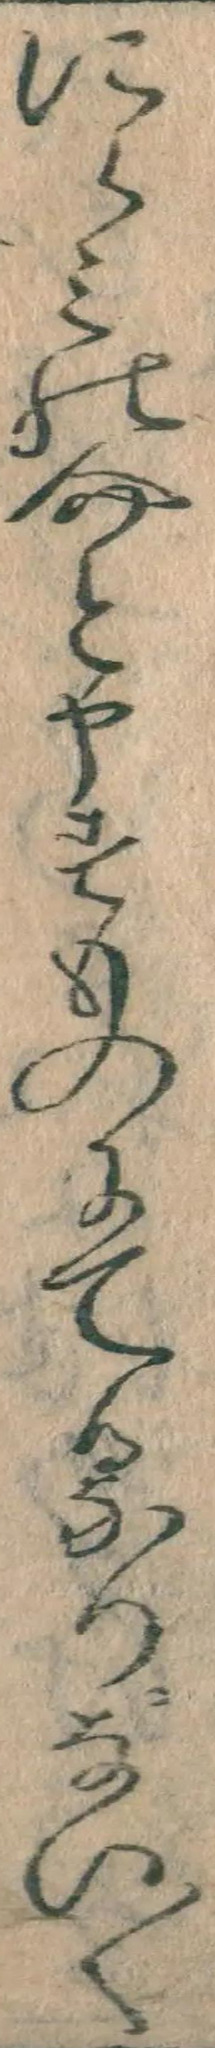にらみの介と申すものにて侍なり。ない〳〵
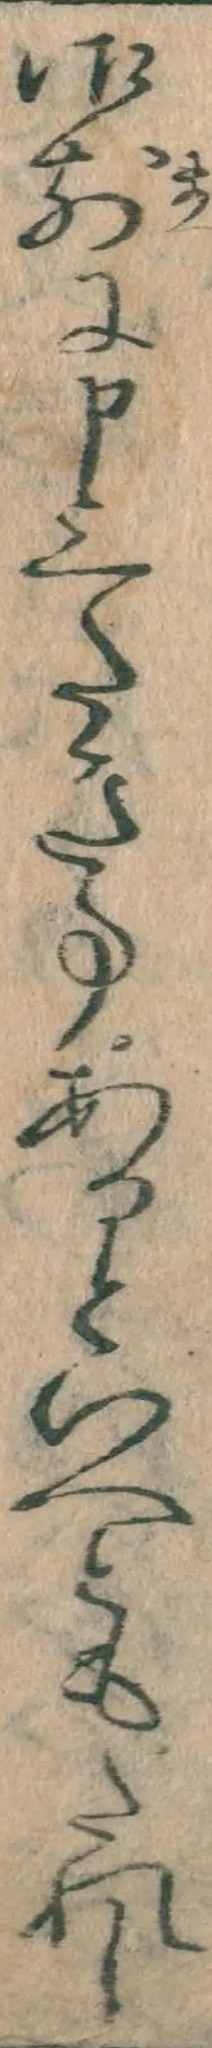御前に申上たき事。あるといへともたれし

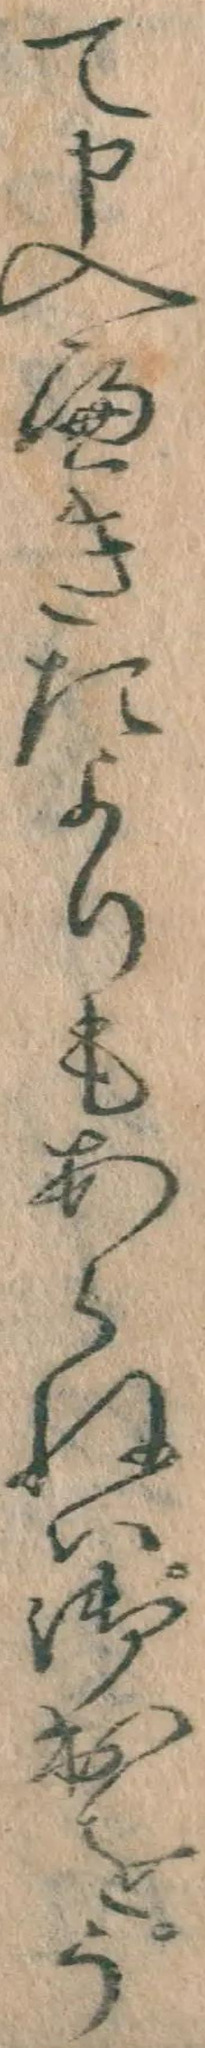て申入へきたよりもあらねは。御出を。う
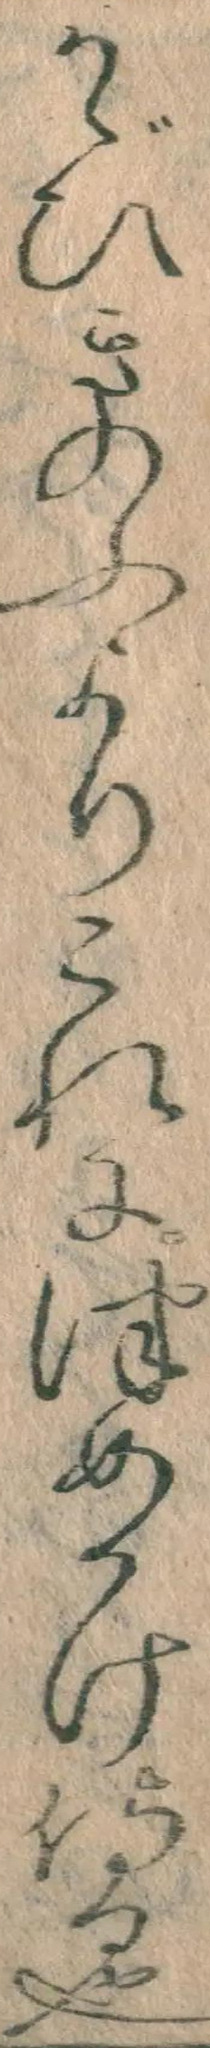かゞひきのふよりこれに。つめかけ侍る也
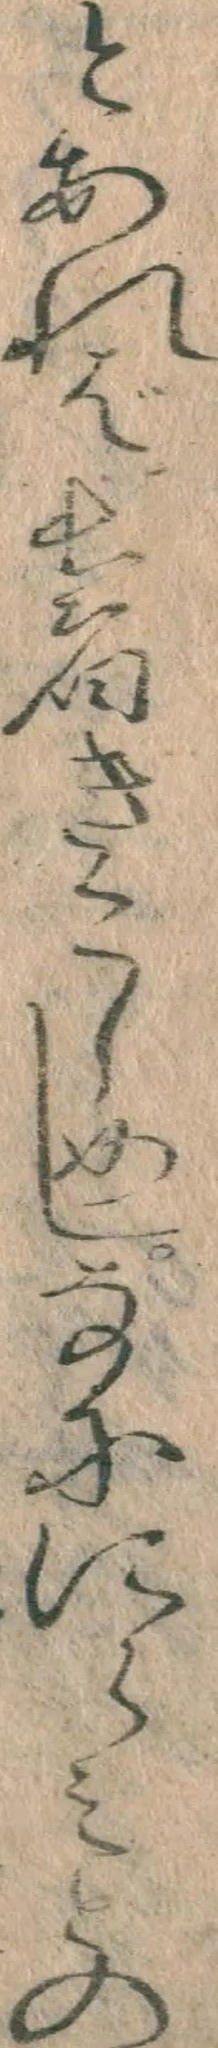とあれば。長者きこしめし。なににらみとの
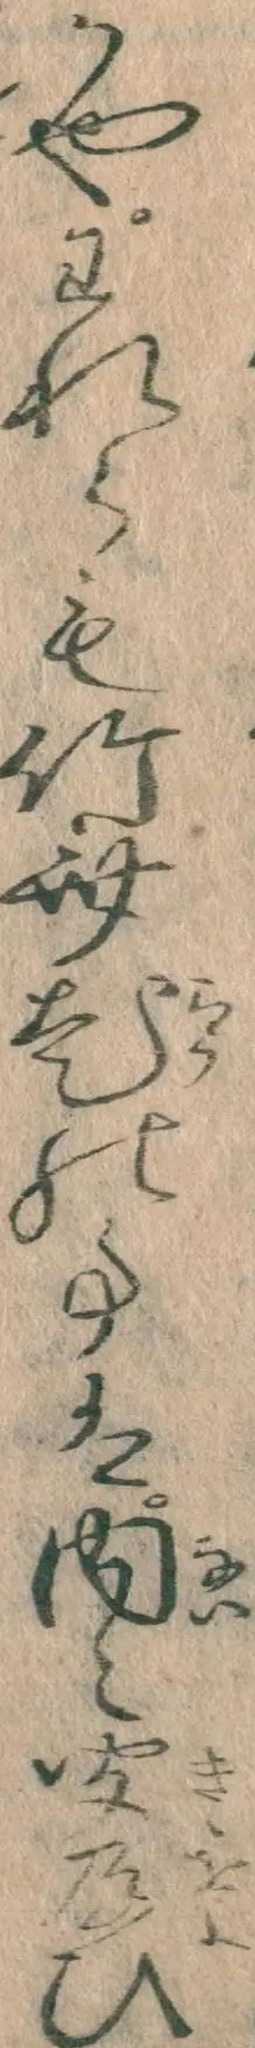かや。われらも竹斎老の事は。内々聞及ひ
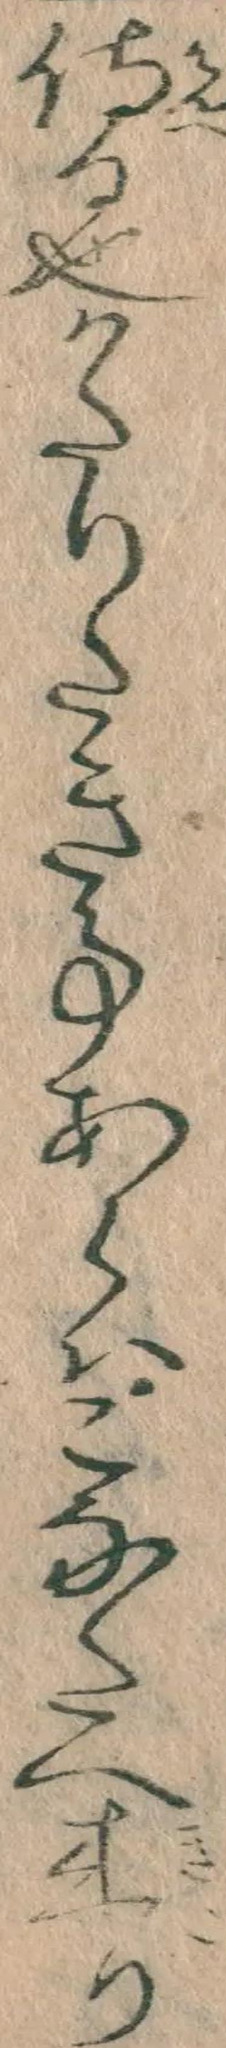侍る也かたりたき事あらは、こなたへ来り
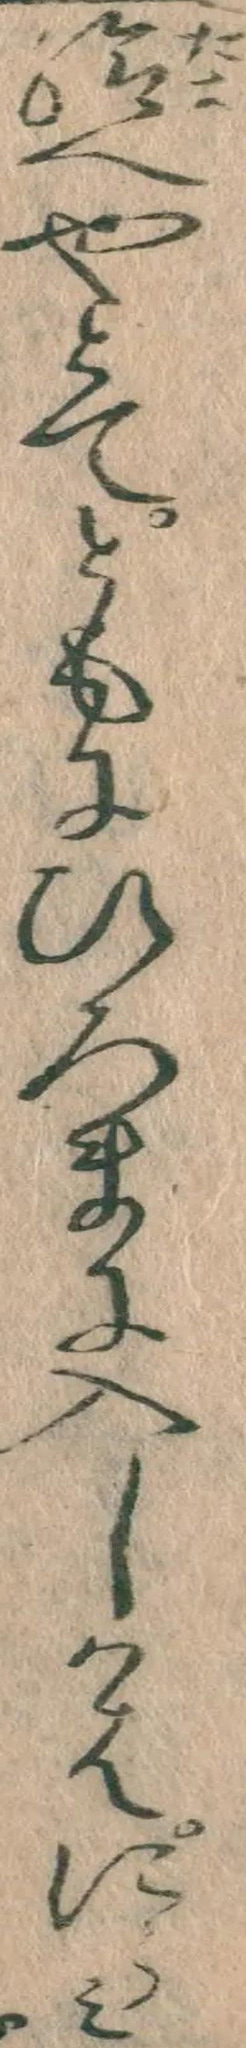給へやとて。ともにひろまに入しかは。にらみ
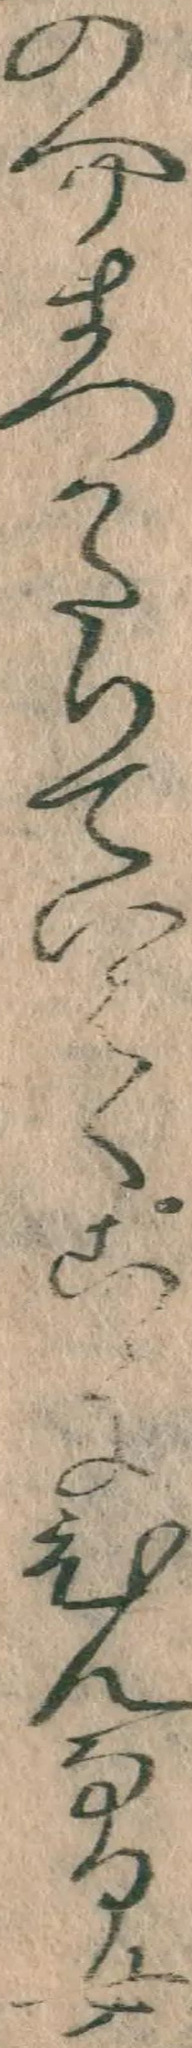の介まづかたりていはく、こゝにひんなる女
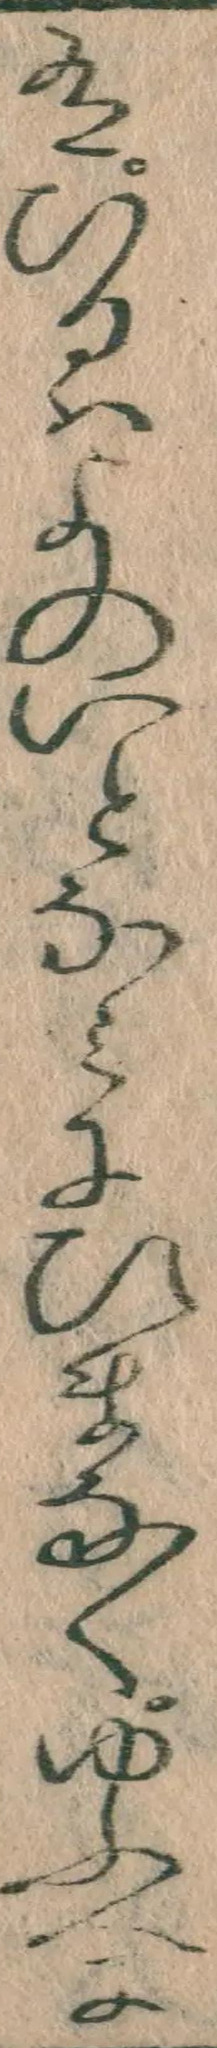有。ひるはよのいとなみにひまなく。ゆふへに
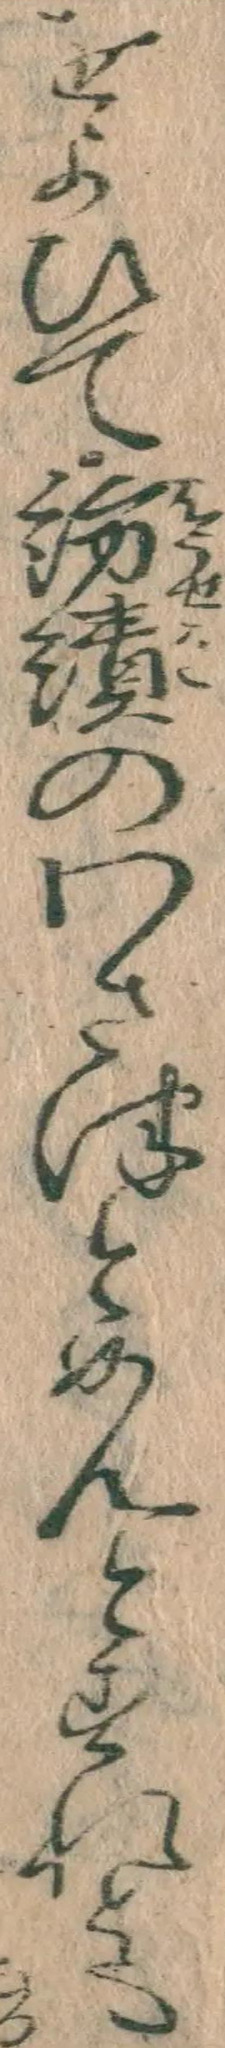をよひて紡績のわさつとめんとすれと
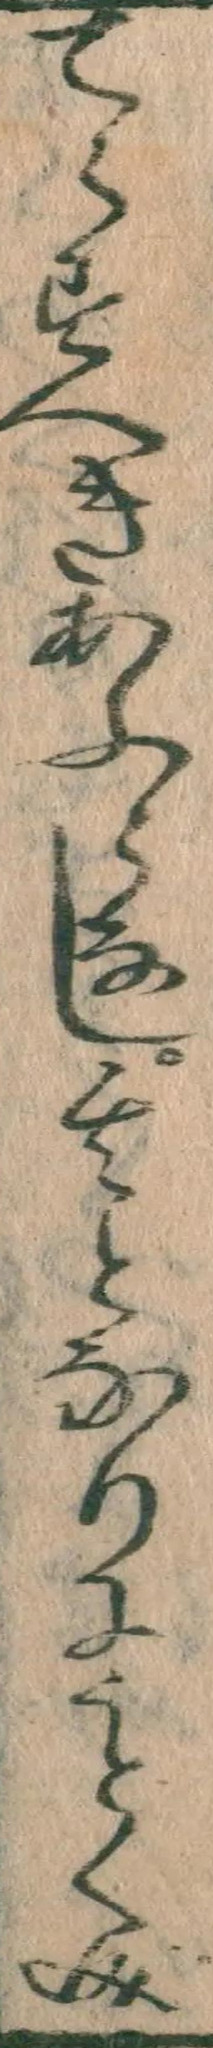てらすへきあふらなし。其となりにうとく成
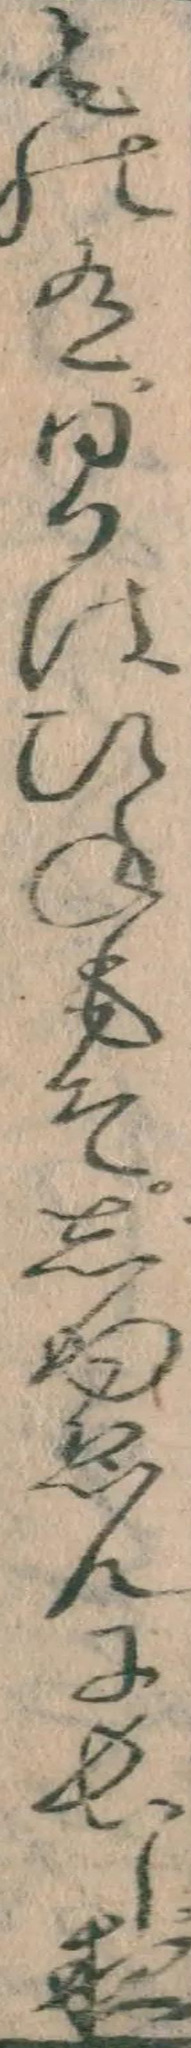もの有。ひるはひねもそ。しゆゑんに長し。夜
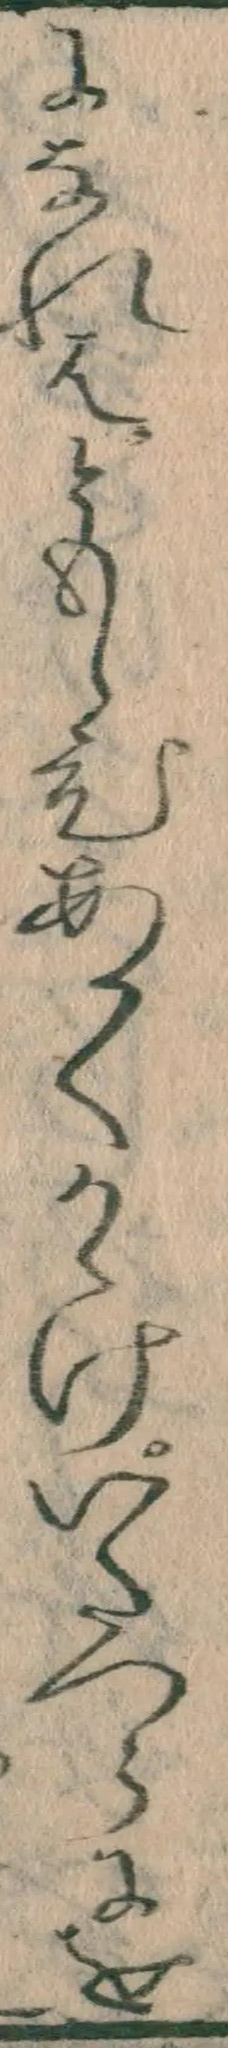になれは。ともしひあかくかゝけ。いたつらにを
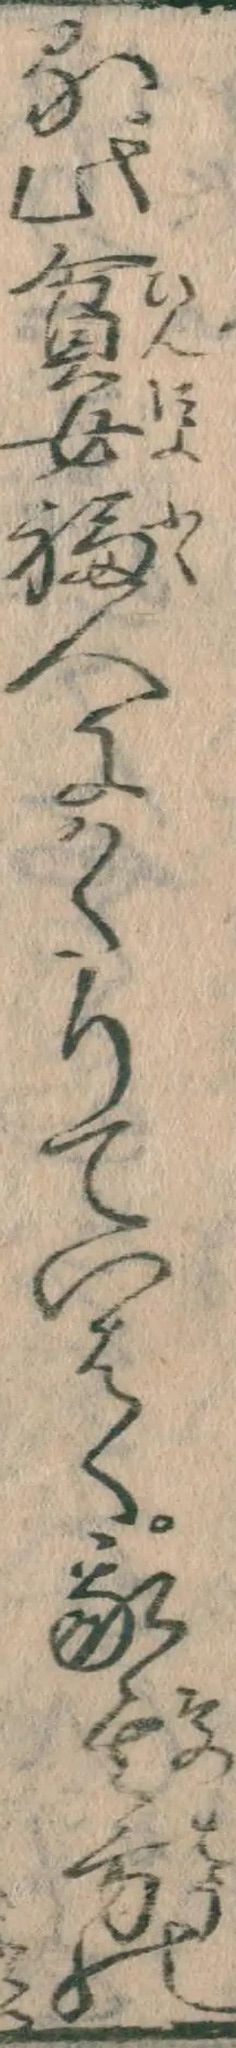る。此貧女福人にかたりていはく。我其方の
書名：竹斎狂歌物語 3巻
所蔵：国立国会図書館 National Diet Library, JAPAN
